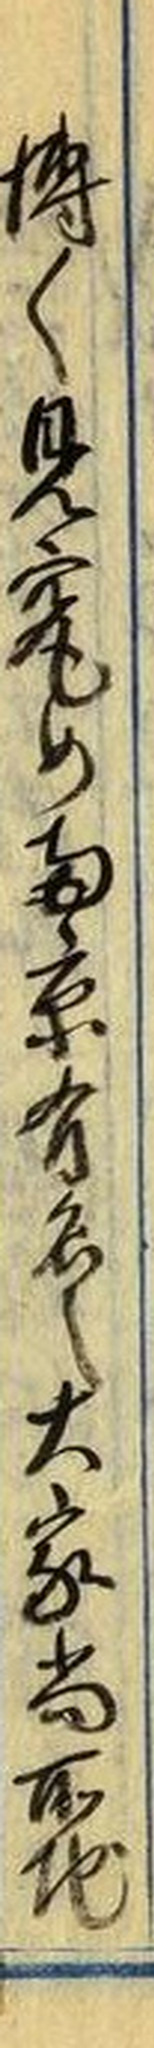博く見究め両京有名之大家尚所地
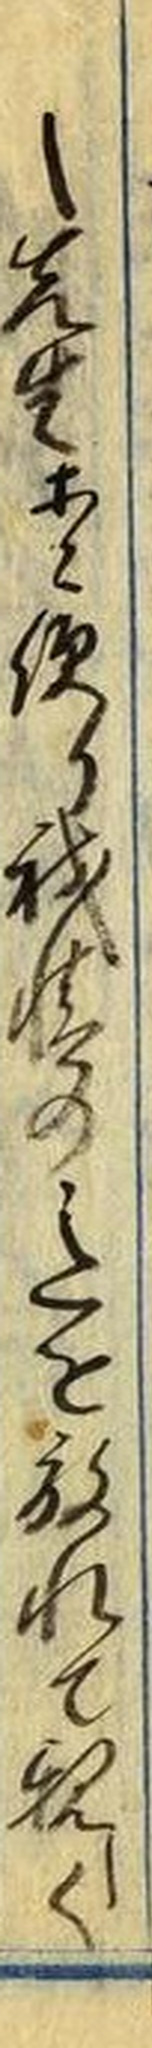之先生等に便り我情の意を放れて親しく
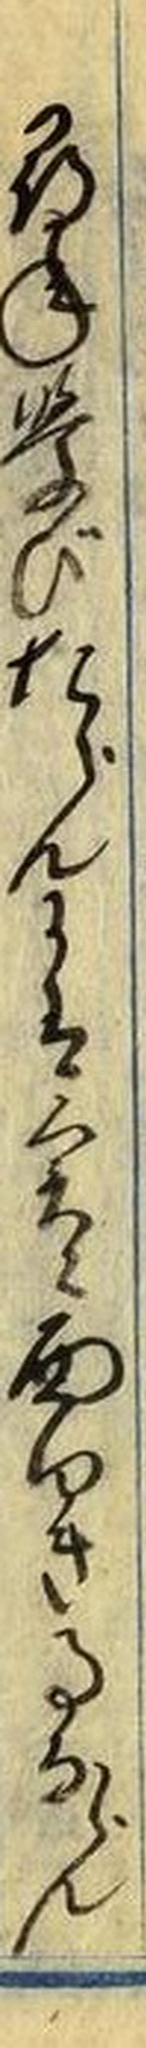尋ね学びたらんには実に面白き事ならん
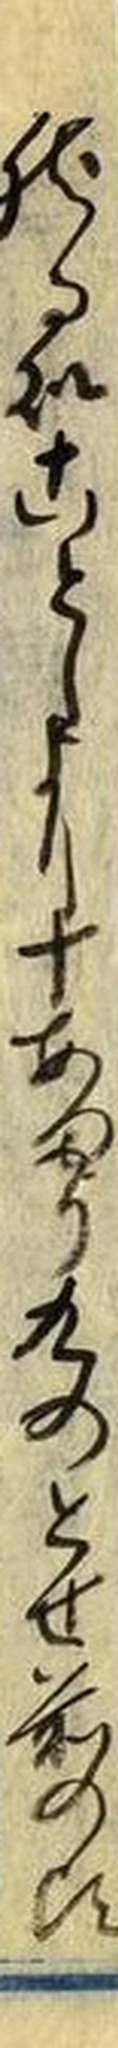然る処ことしより十あまり九のとせ前の頃
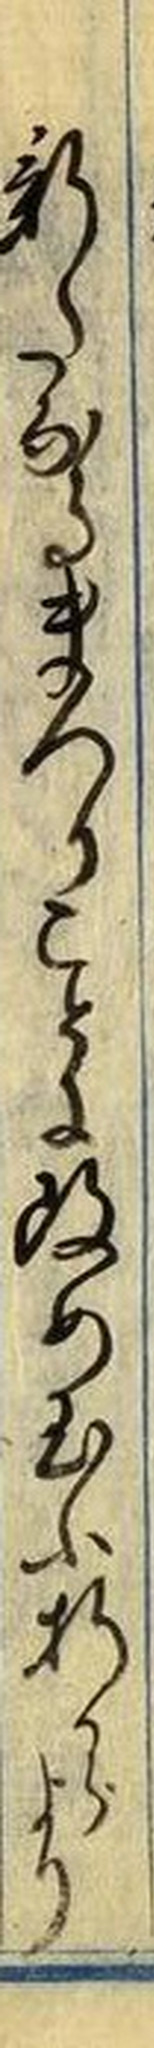新たなるまつりことに改め玉ふ折からより
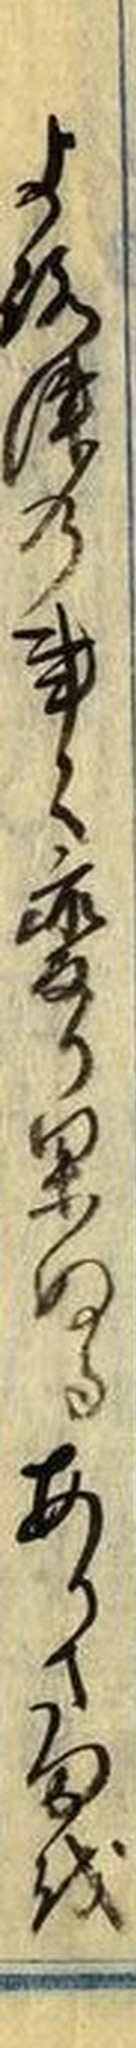よろつの事々変り果ぬるありさまを
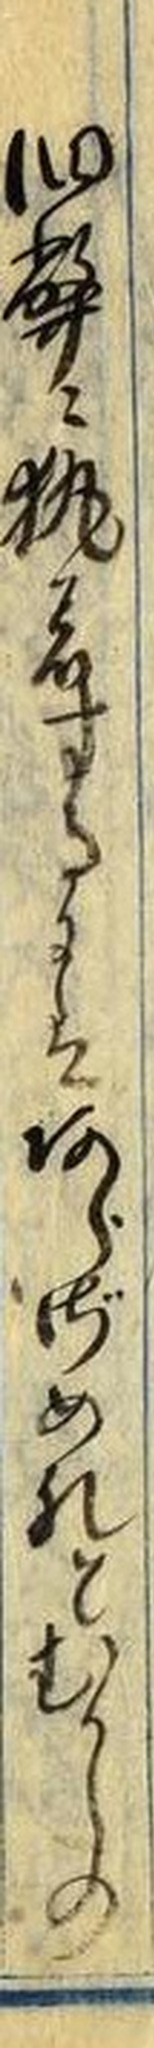旧弊に執着するにはあらざめれどむかし

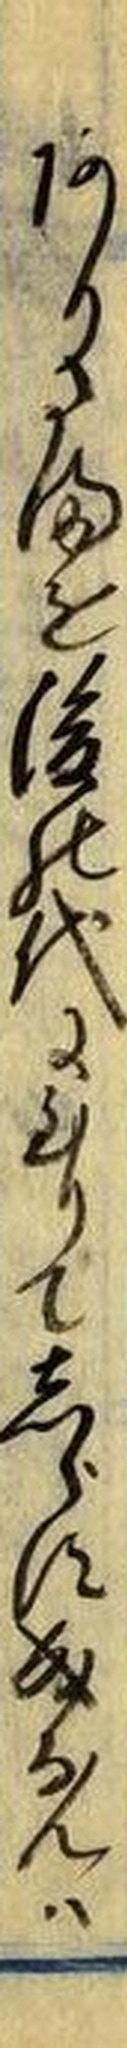ありさまを後の代に至りてしらす成なんは
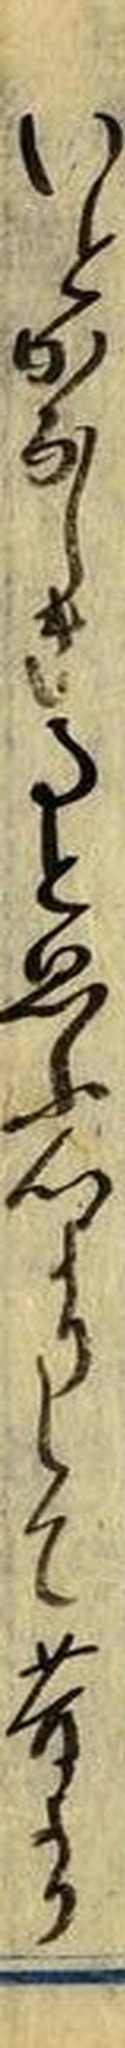いとかなしき事と思ふ心よりして昔より
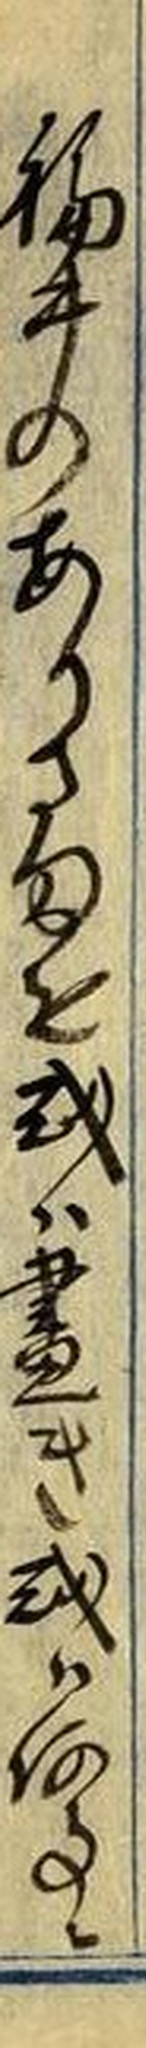福井のありさまを或は画き或は何事に
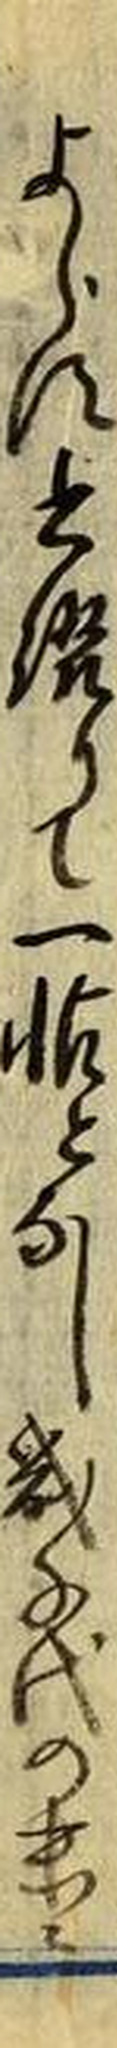よらす書綴りて一帖となし幾千代の末に
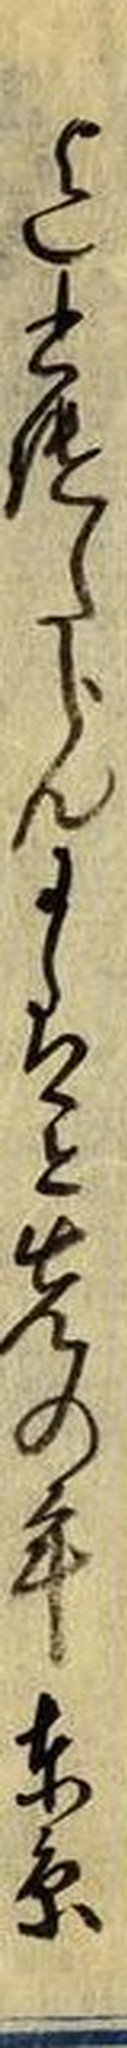迄書継たらんにはと先の年東京
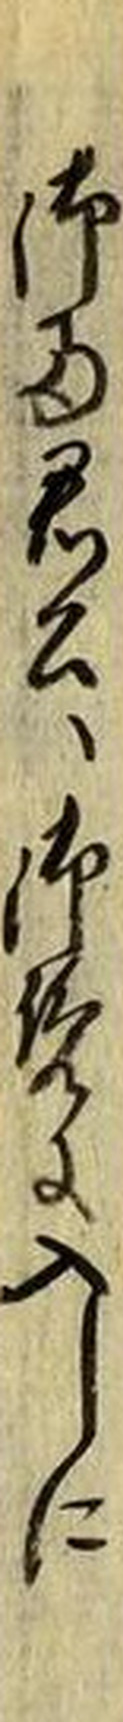御両君公へ御覧に入しに
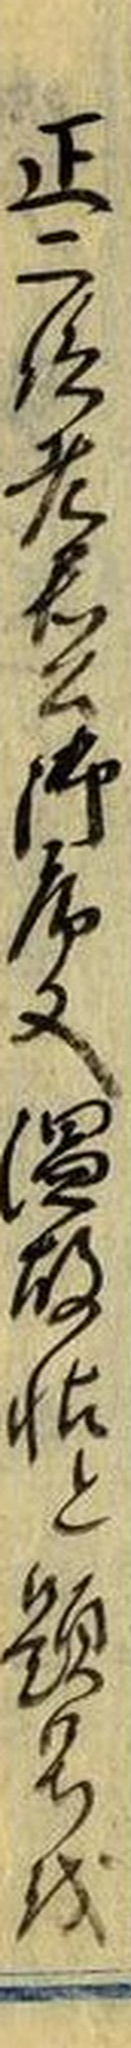正二位老君公御序又温故帖と題号を
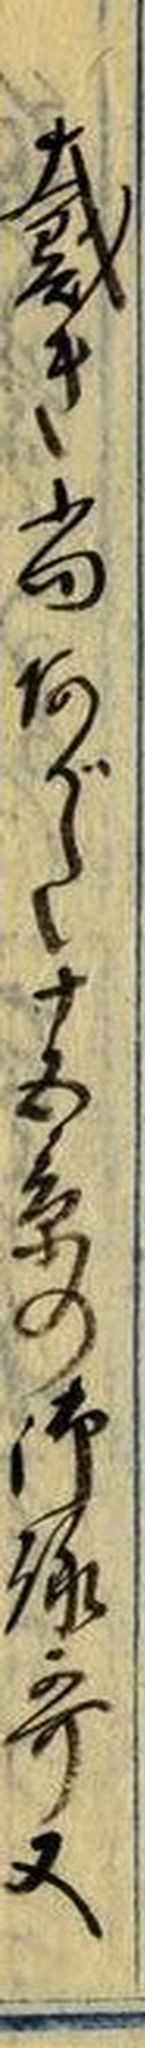戴き尚あがた十五景の御詠歌又
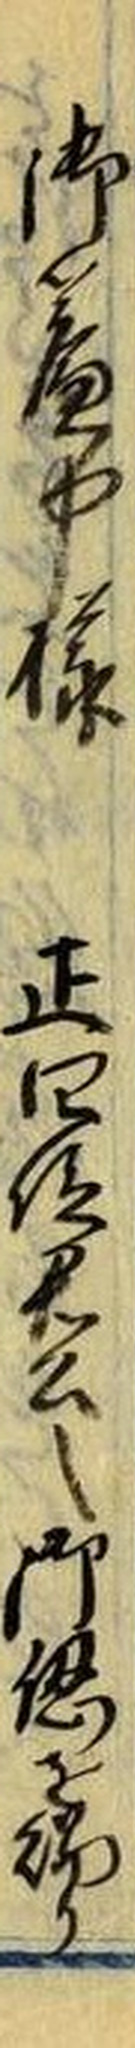御簾中様正四位君公之御認を賜り
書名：温古集 三巻
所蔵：福井県文書館 Fukui Prefectural Archives
